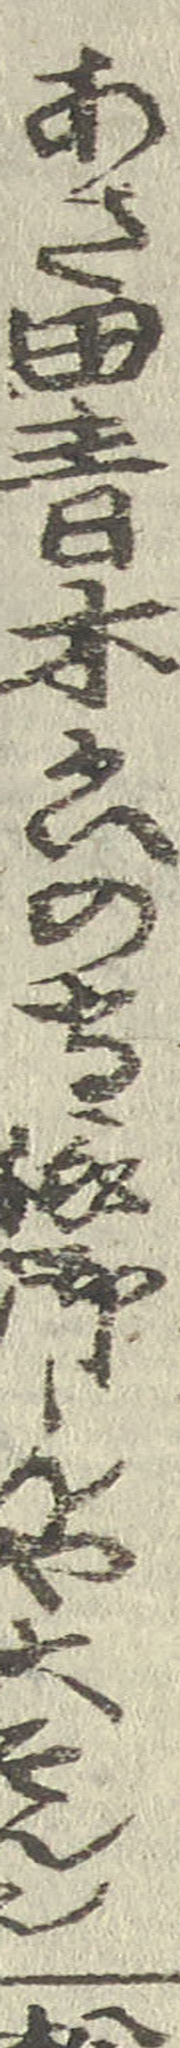あさ田青木かいの守様御しんや大そん也
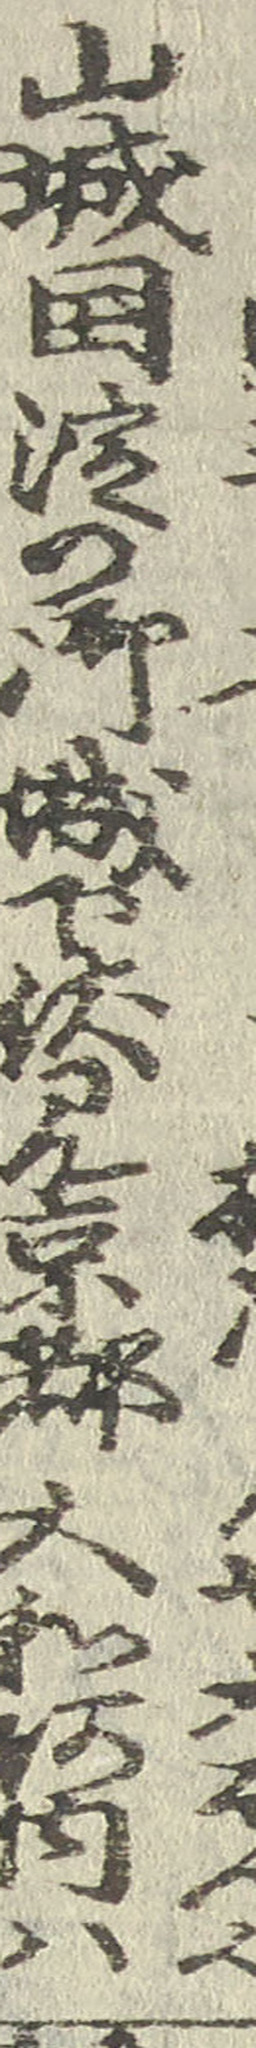山城国淀の御城下伏見京都大和河内は
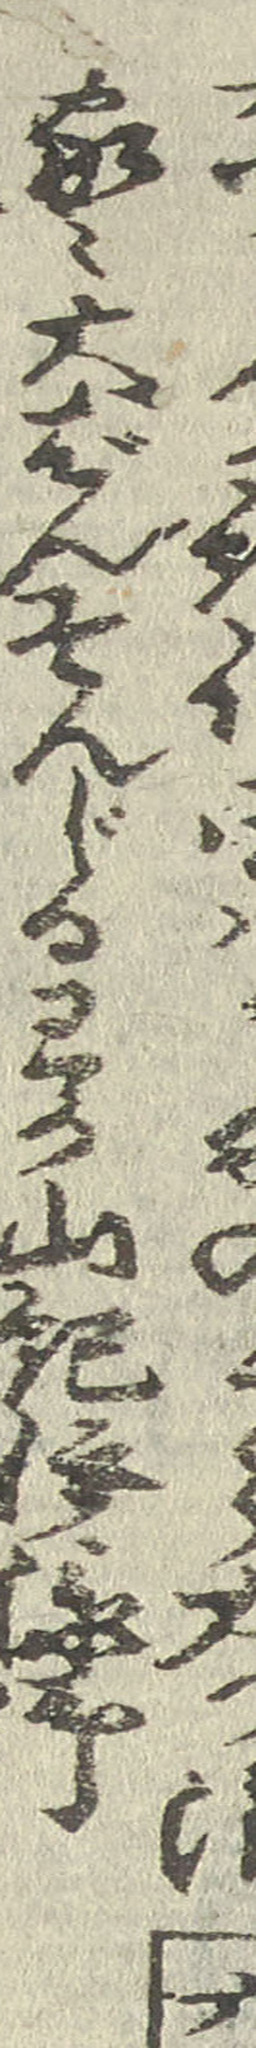家々大ばんそんじるわか山紀伊様御
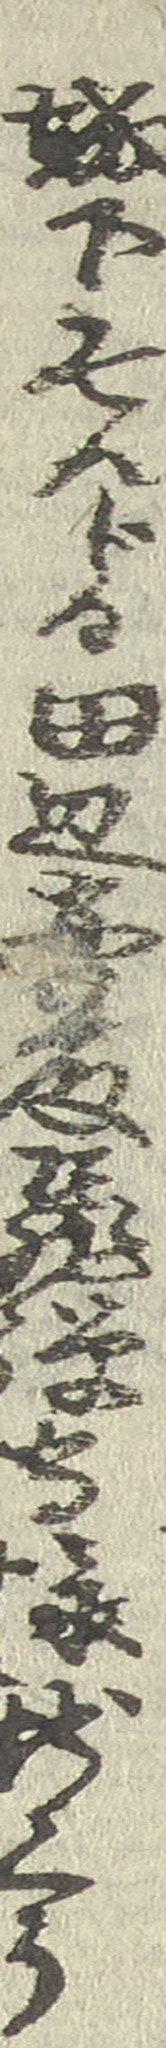城下そんじる田辺安籐飛騨守様新くう
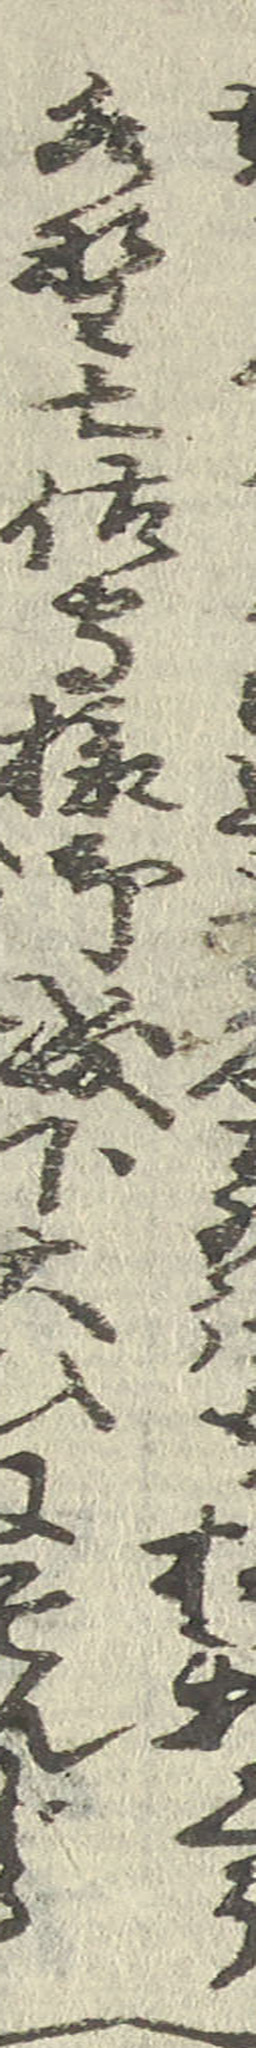水野土佐守様御城下大ひにそんじる
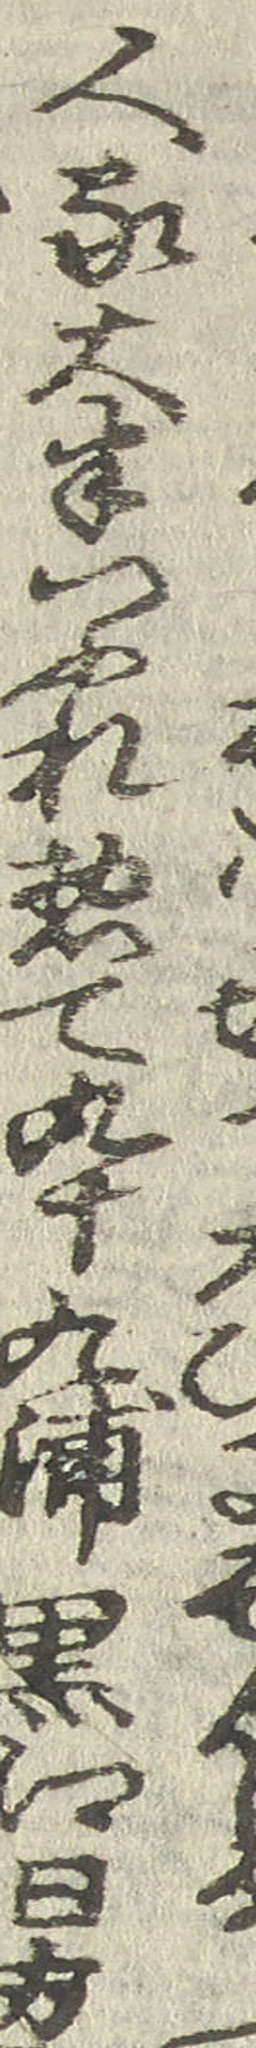人家大半つふれ惣て九十九浦黒江日方
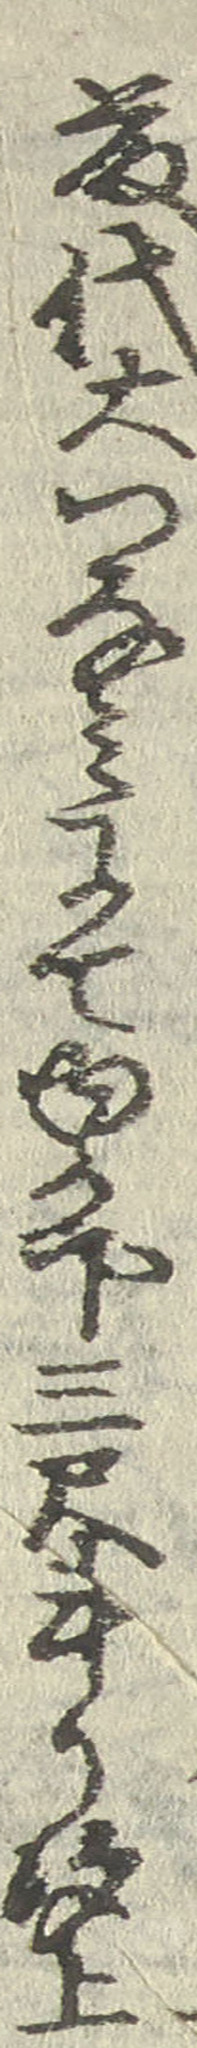藤代大つなみにてゆか下三尺斗り汐上
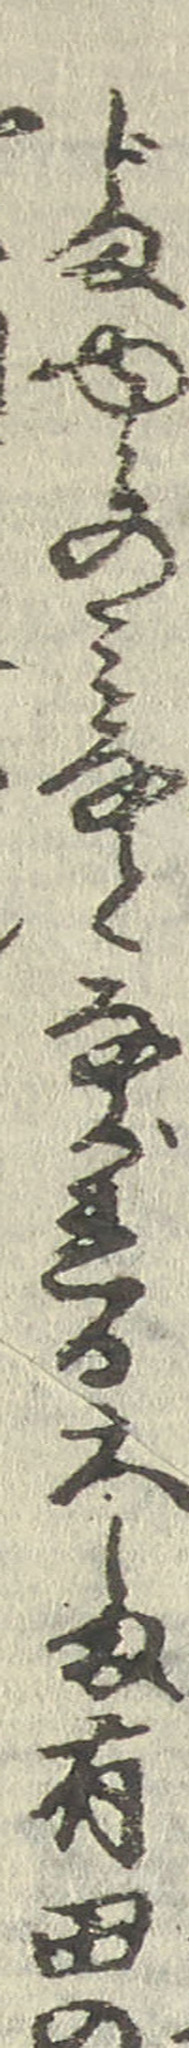じまゆらのみなとながれる大しま有田の
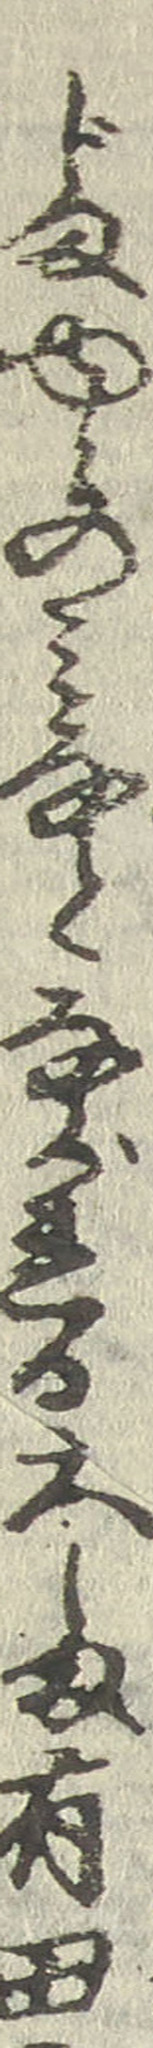じまゆらのみなとながれる大しま有田の
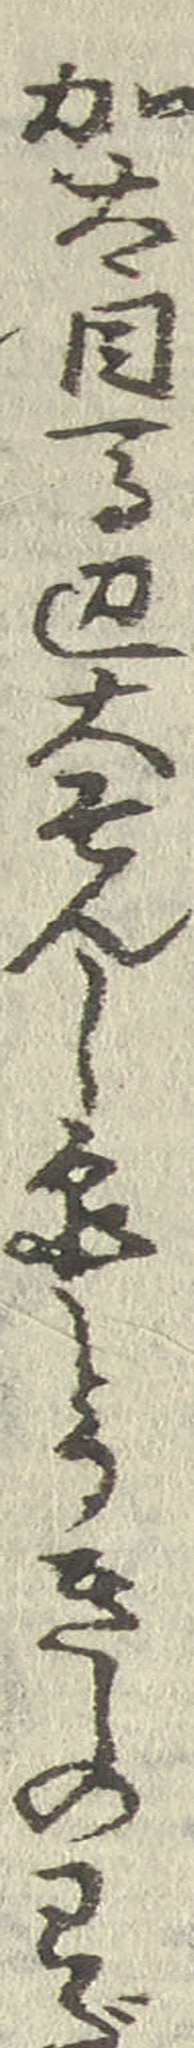加太目馬辺大そんし泉しうきしのわだ
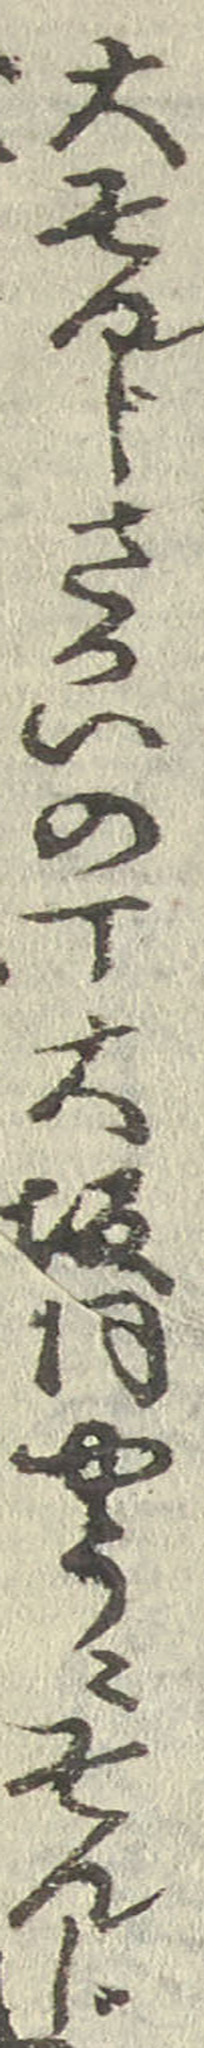大そんじさかいの丁大坂同やうにそんじ
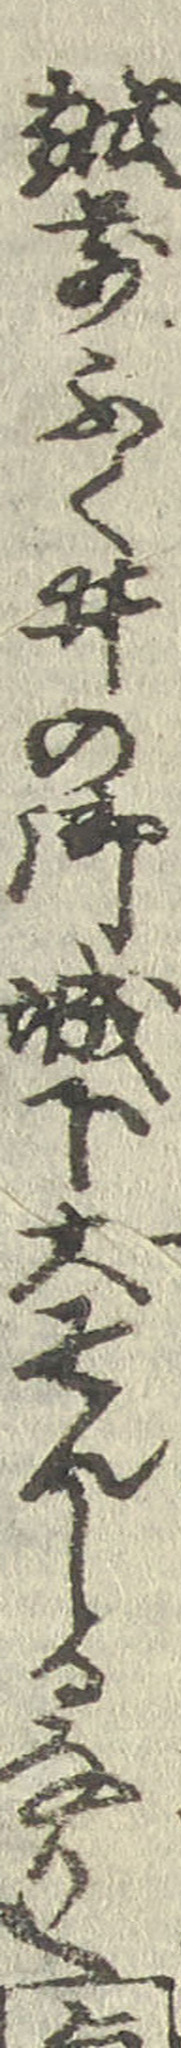越前ふく井御城下大そんしるなり
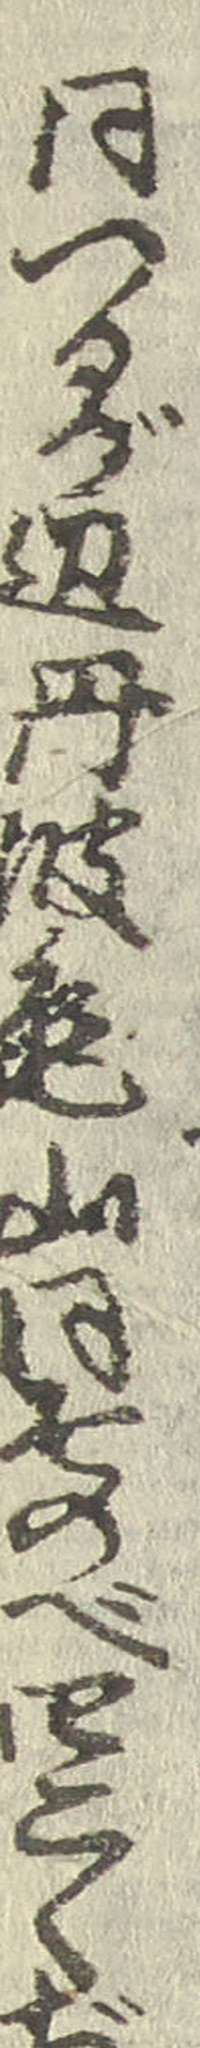同つるが辺丹波亀山同そのべ四こくぢ
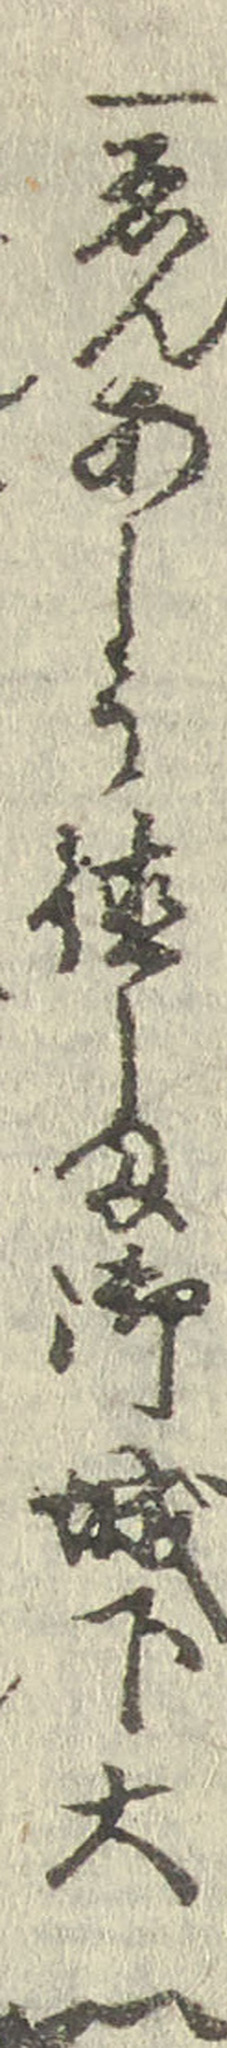一ゑんあしう徳しま御城下大
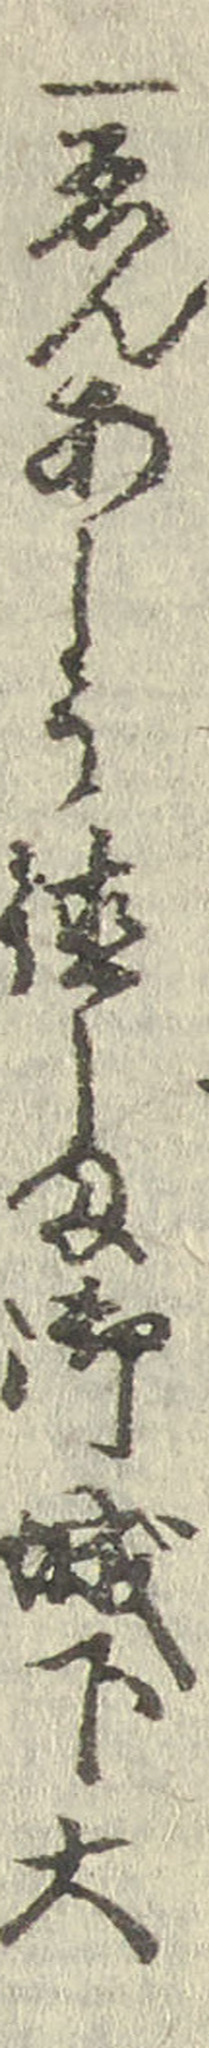一ゑんあしう徳しま御城下大
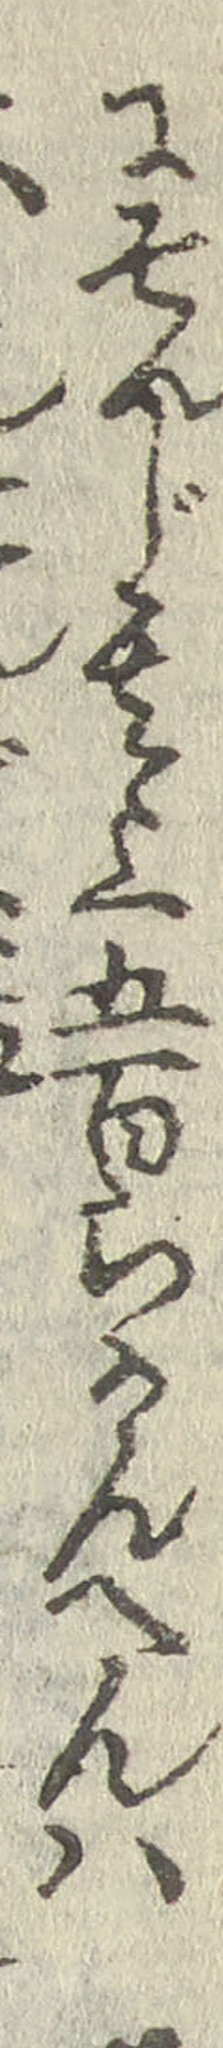にそんじ其上五百らかんへんは
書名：諸国大地震
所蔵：東京大学総合図書館 General Library in the University of Tokyo, JAPAN
